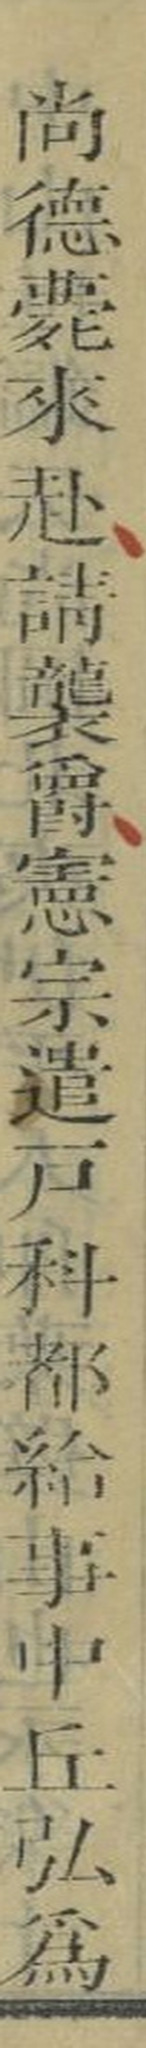尚徳薨来赴請襲爵憲宗遣戸科都給事中丘弘為
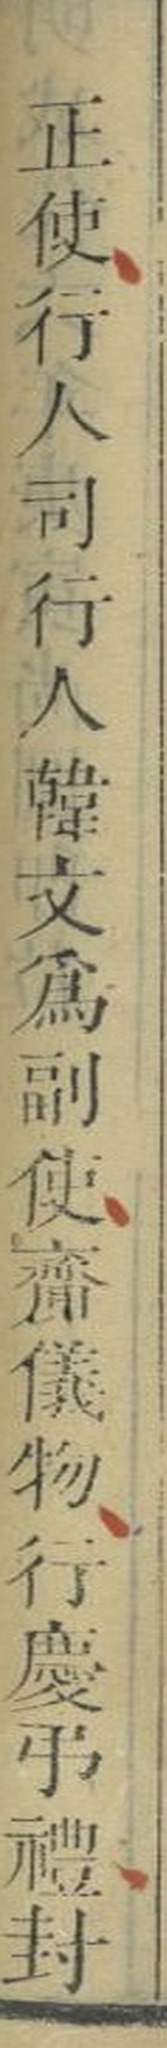正使行人司行人韓文為副使齎儀物行慶弔礼封
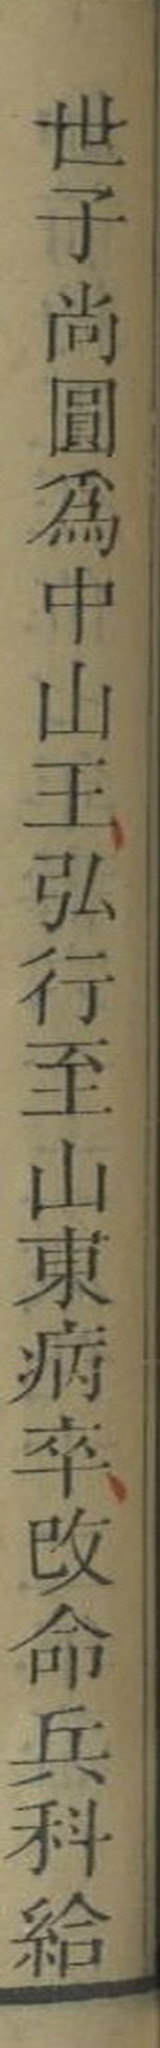世子尚円為中山王弘行至山東病卒改命兵科給
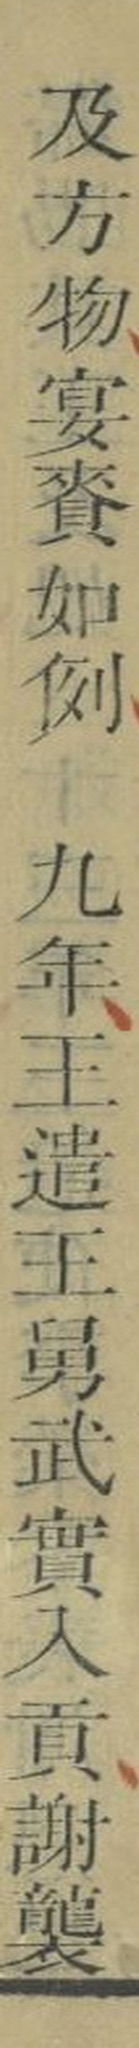及方物宴賚如例九年王遣王舅武実入貢謝襲
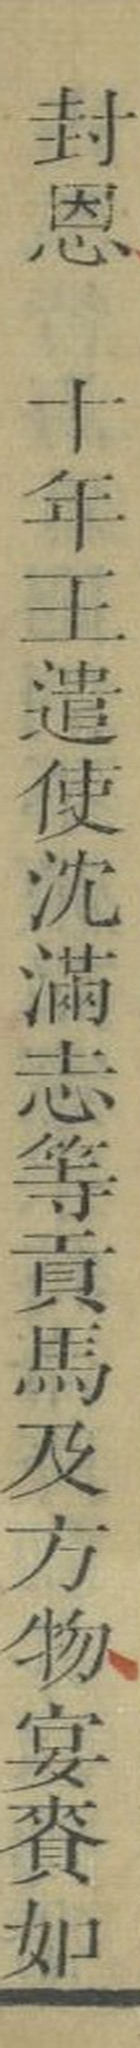封恩十年王遣使沈満志等貢馬及方物宴賚如
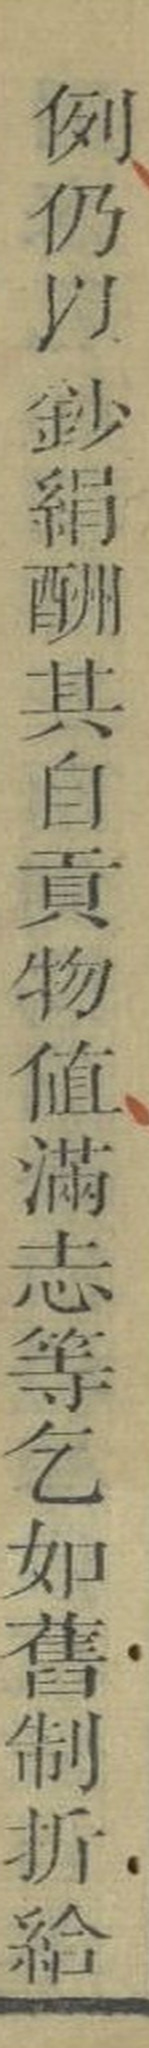例仍以鈔絹酬其自貢物値満志等乞如旧制折給
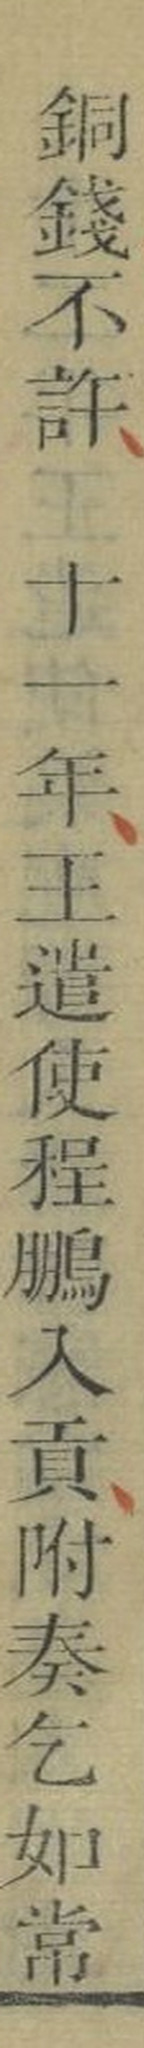銅銭不許十一年王遣使程鵬入貢附奏乞如常
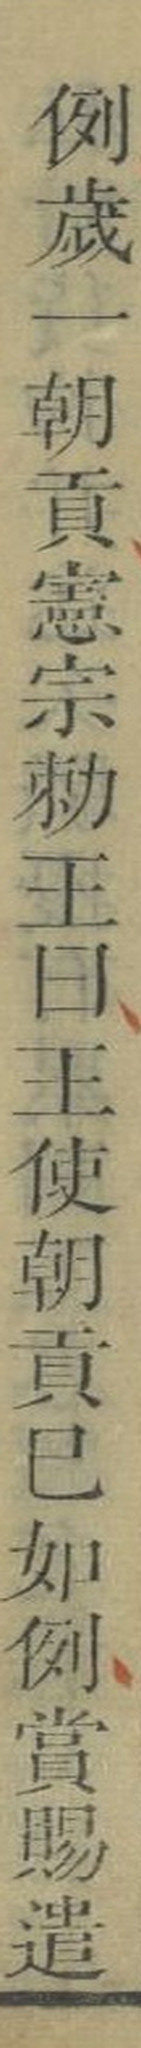例歳一朝貢憲宗勅王曰王使朝貢巳如例賞賜遣
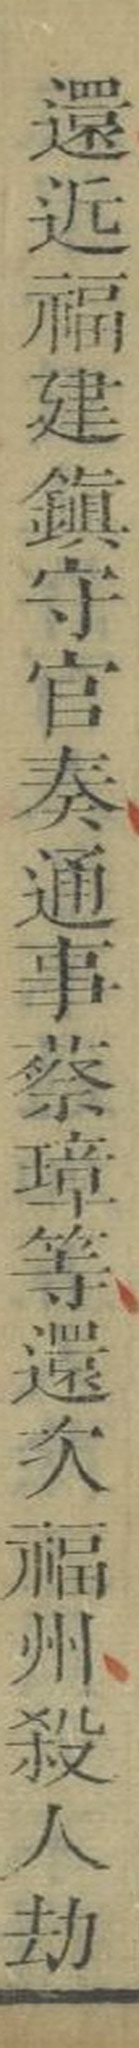還近福建鎮守官奏通事蔡璋等還次福州殺人劫
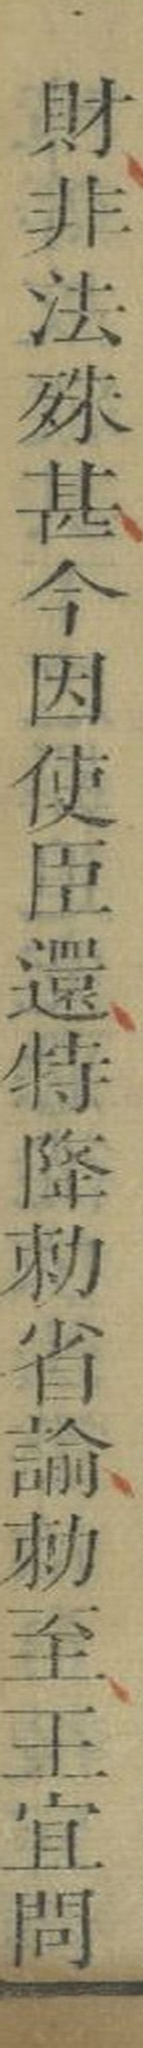財非法殊甚今因使臣還特降勅省諭勅至王宜問

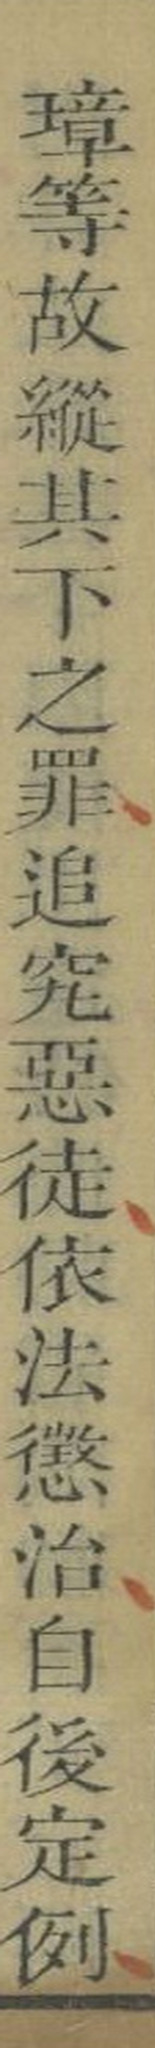璋等故縦其下之罪追究悪徒依法懲治自後定例
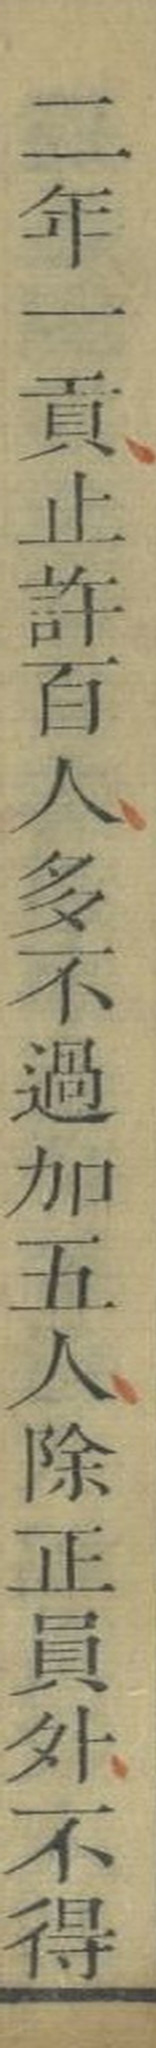二年一貢止許百人多不過加五人除正員外不得
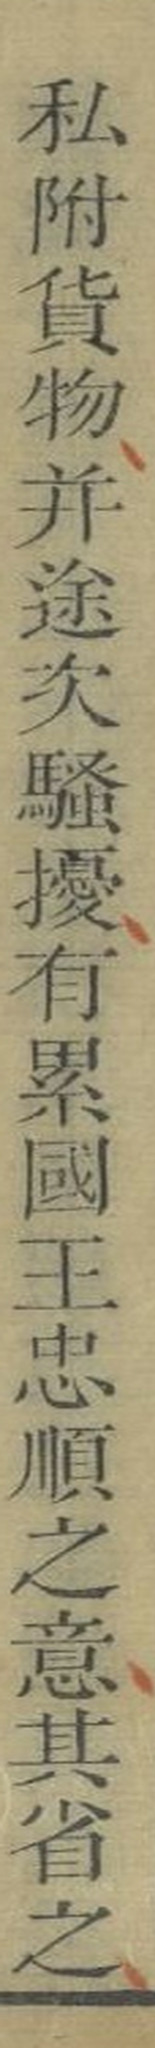私附貨物并途次騒擾有累国王忠順之意其省之
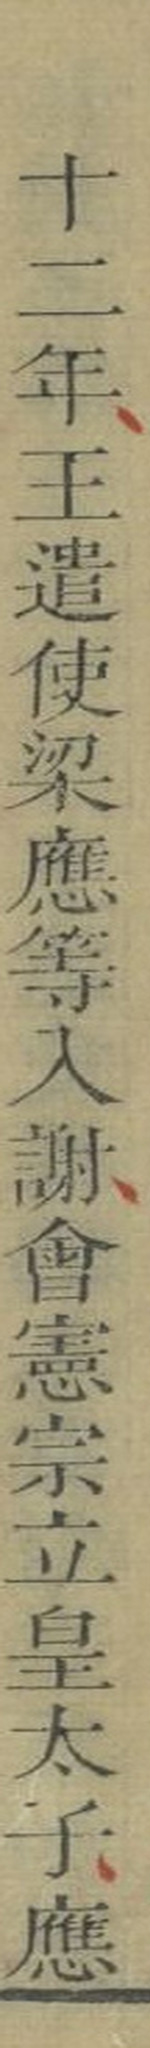十二年王遣使梁応等入謝会憲宗立皇太子応
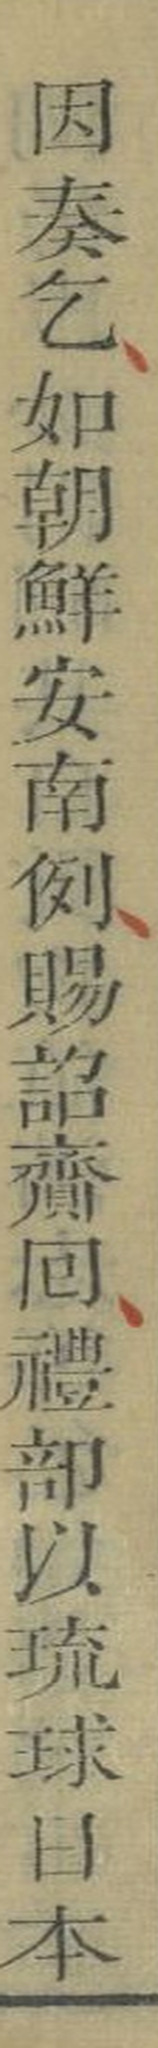因奏乞如朝鮮安南例賜詔齎回礼部以琉球日本
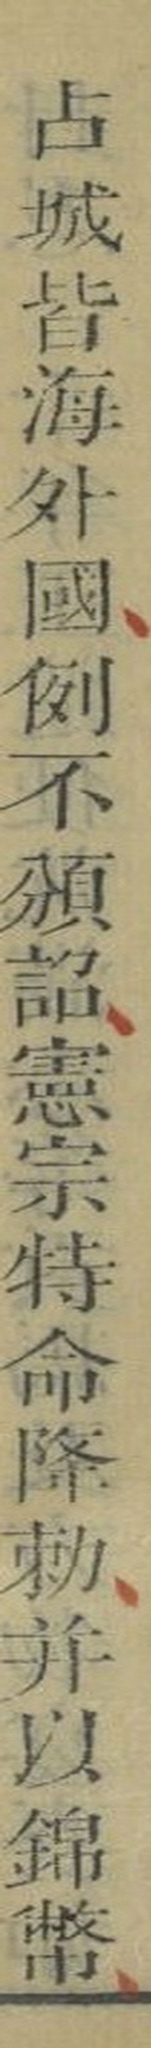占城皆海外国例不頒詔憲宗特命降勅并以錦幣
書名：中山伝信録 巻三
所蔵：University of the Ryukyus Library
